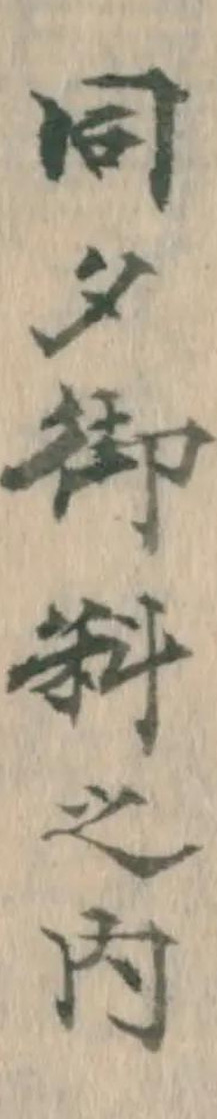同夕御料之内
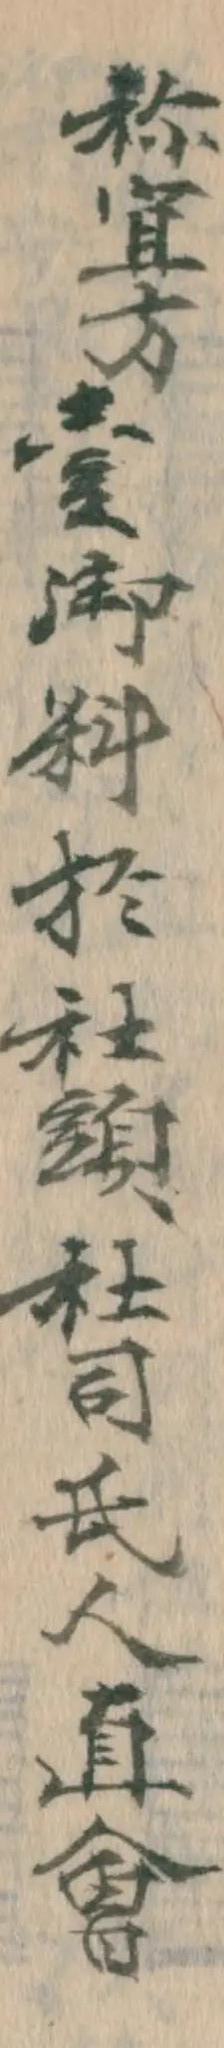祢宜方壱御料於社頭社司氏人直会
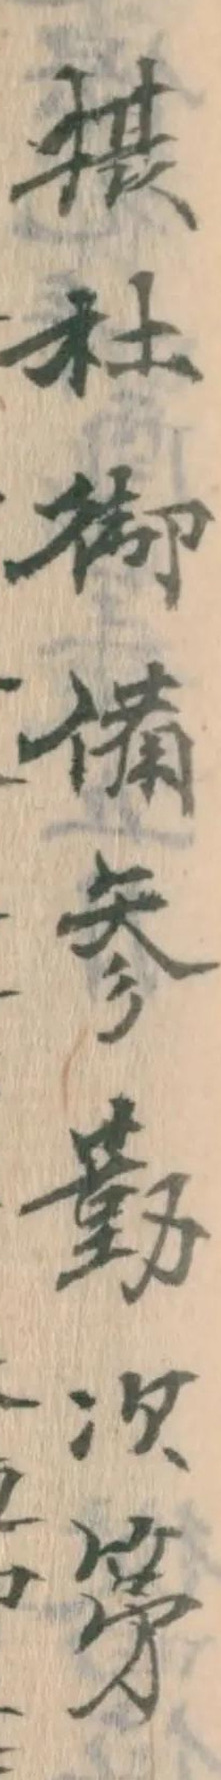摂社御備参勤次第
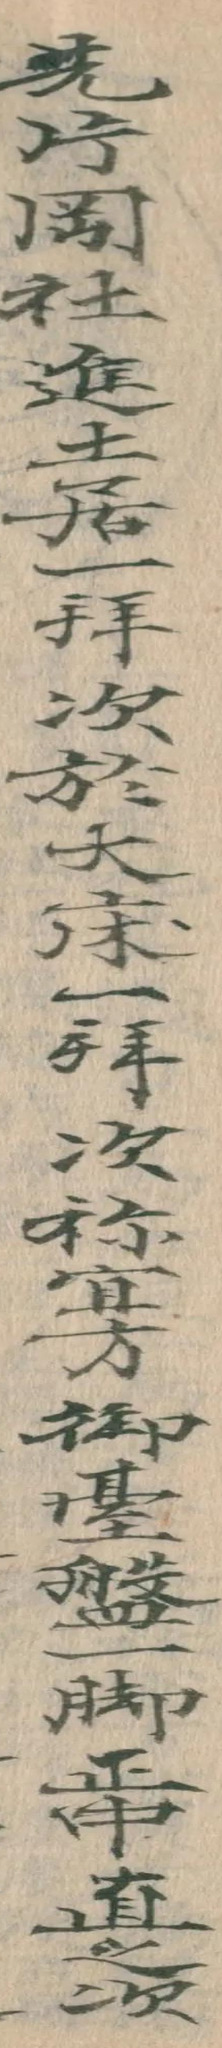先片岡社進土居一拝次於大床一拝次祢宜方御台盤一脚正中直之次

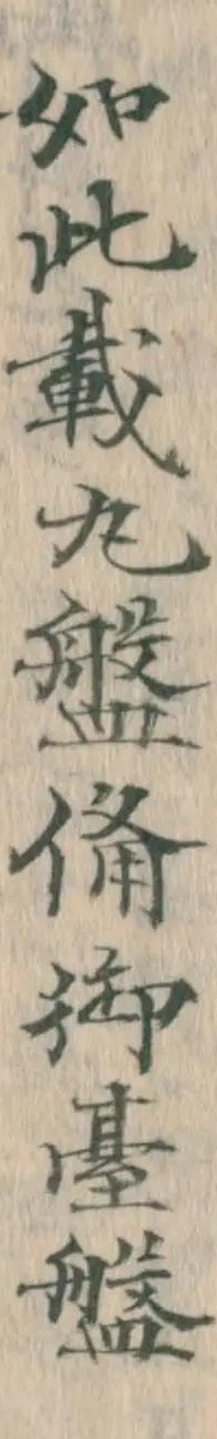如此載丸盤備御台盤
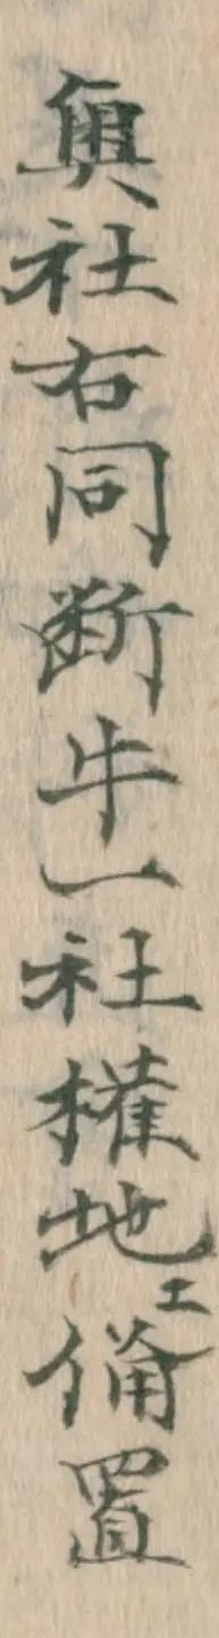奥社右同断牛一社権地エ備置
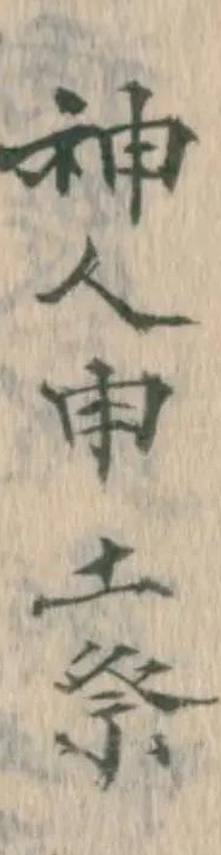神人申土祭
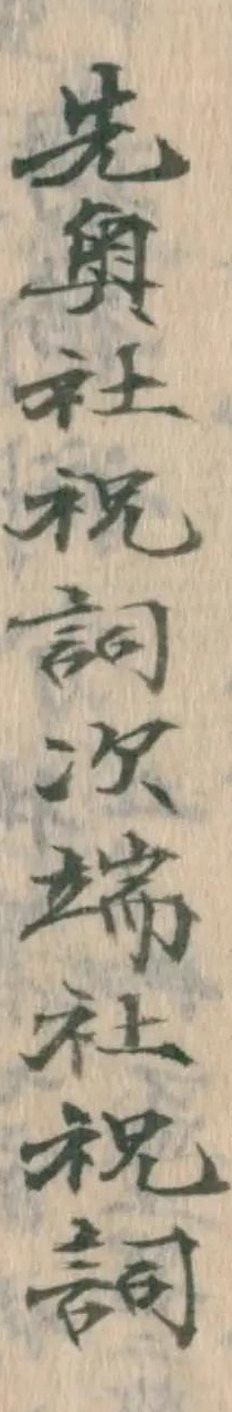先奥社祝詞次端社祝詞
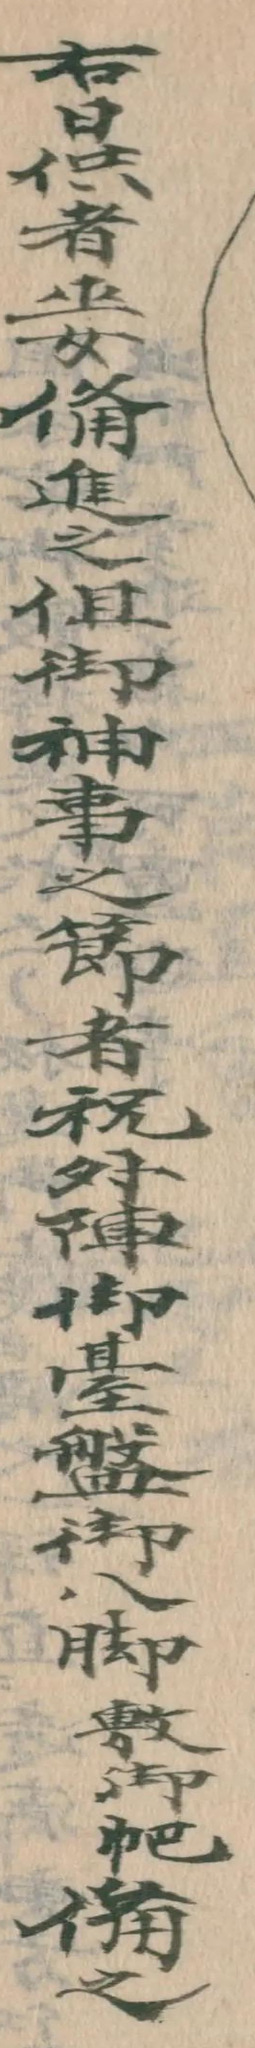右日供者巫女備進之但御神事之節者祝外陣御台盤御八脚敷御帊備之
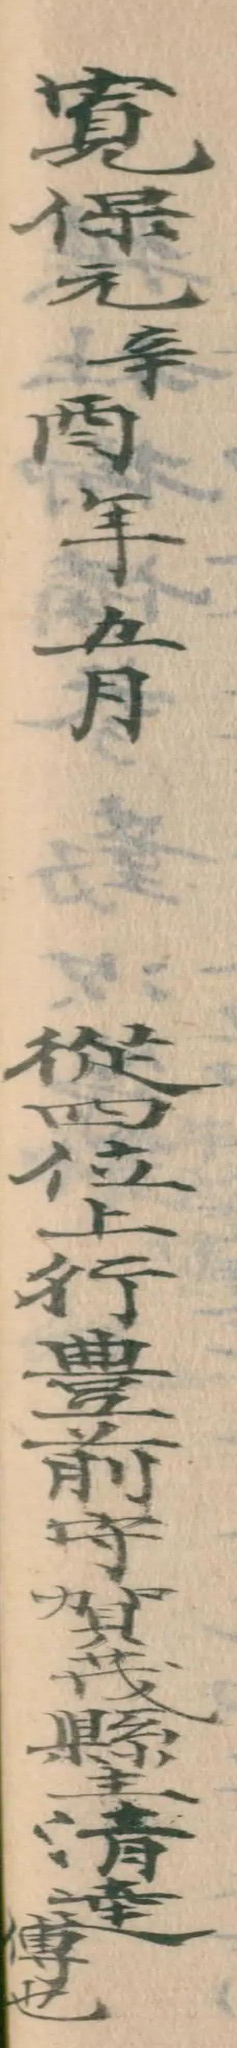寛保元辛酉年五月従四位上行豊前守賀茂県主清達
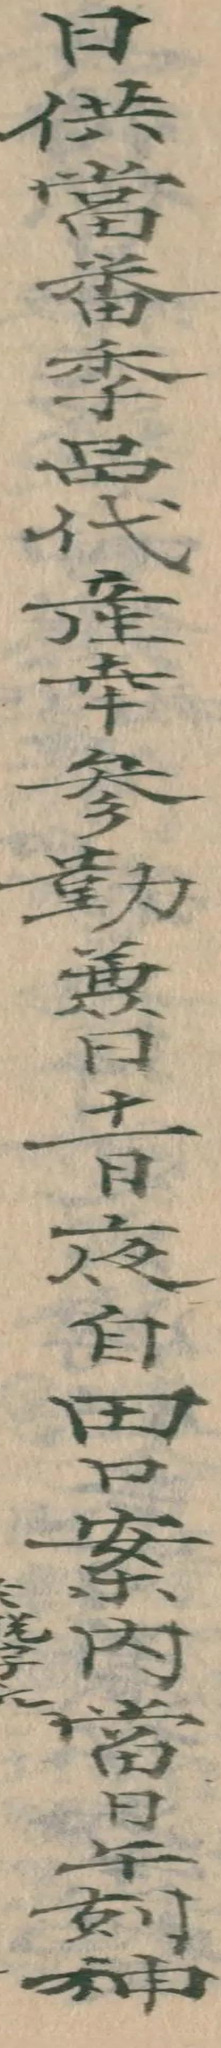日供当番李品代産幸参勤兼日十一日夜自田口案内当日午剋神

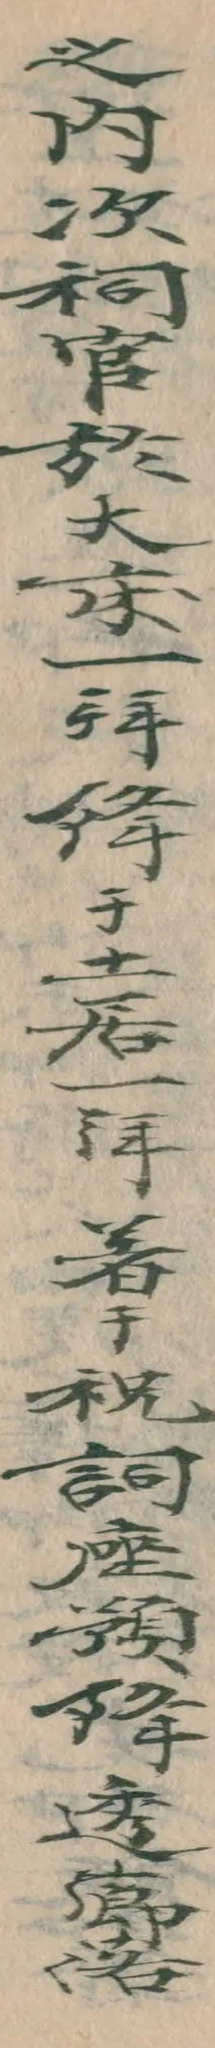之内次祠官於大床一拝降于土居一拝着于祝詞座預降透廊落
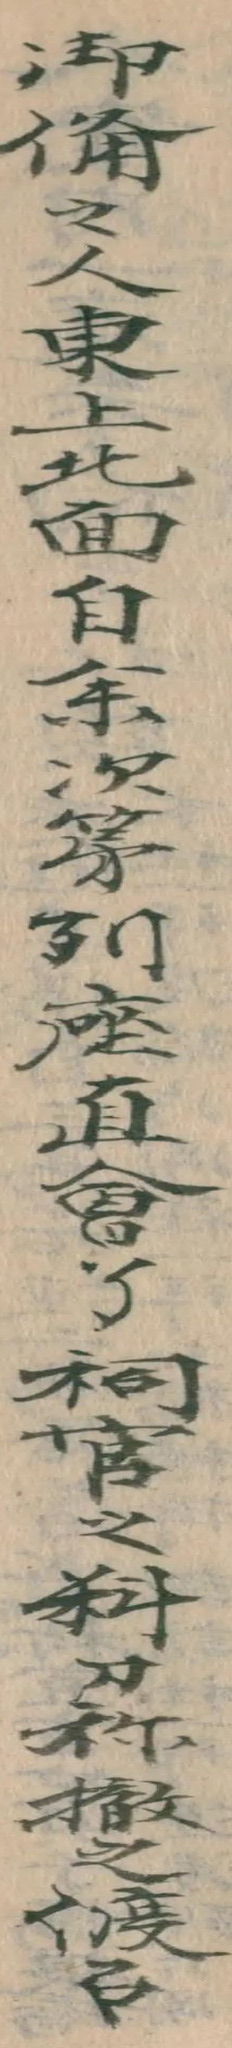御備之人東上北面自余次第列座直会了祠官之料刀祢撤之渡召
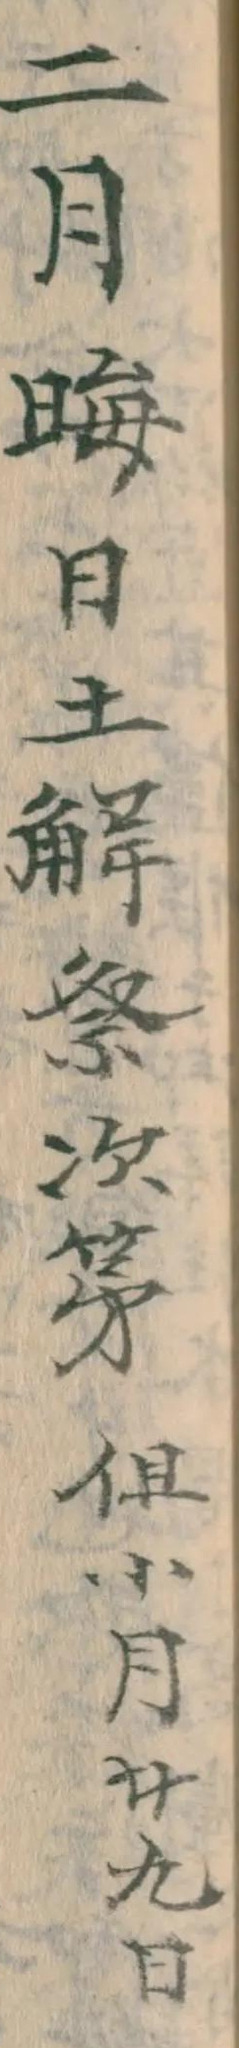二月晦日土解祭次第但小月廿九日
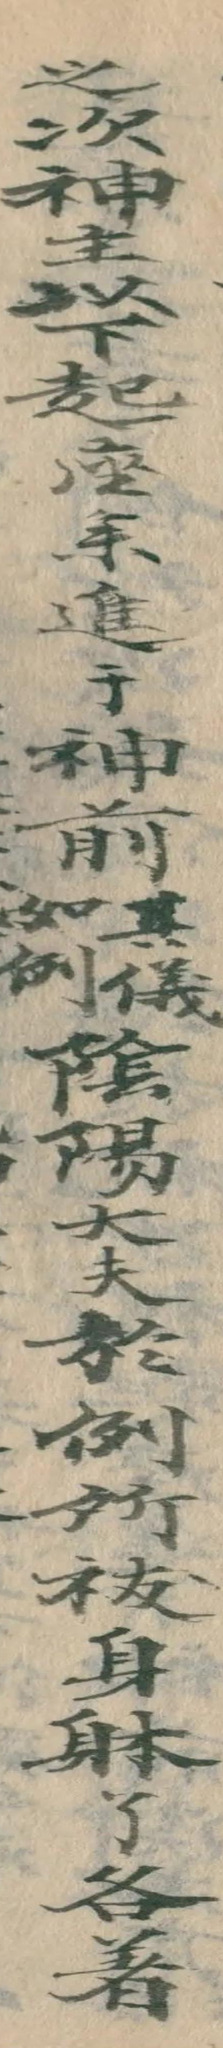之次神主以下起座参進于神前其儀如例陰陽大夫於例所祓身躰了各着

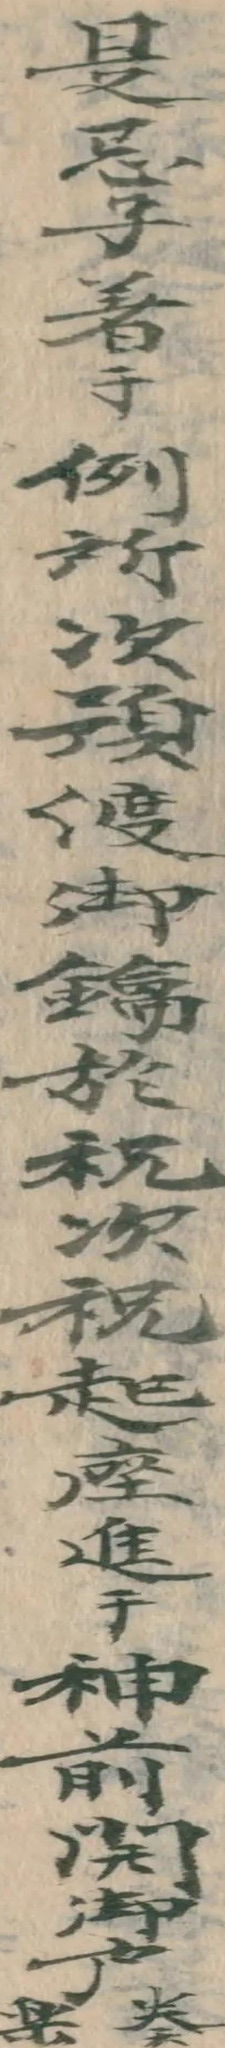是忌子着于例所次預渡御鑰於祝次祝起座進于神前開御戸奏楽
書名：賀茂社記録. 第9冊
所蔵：国立国会図書館 National Diet Library, JAPAN
